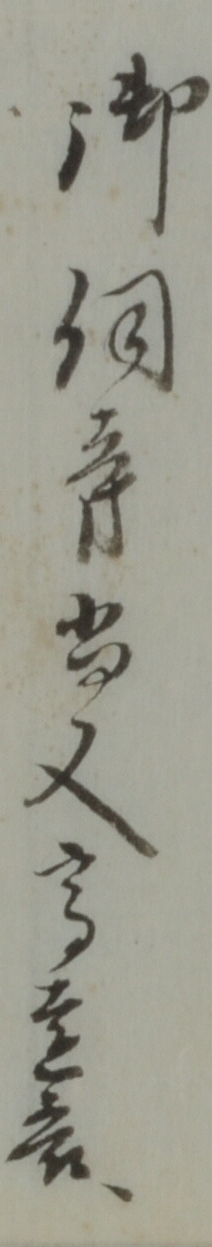御伺旁尚又高遠表へ
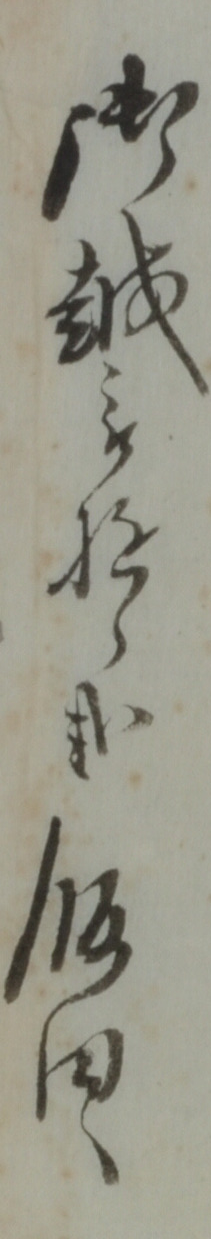御越被遊候哉飯田へ
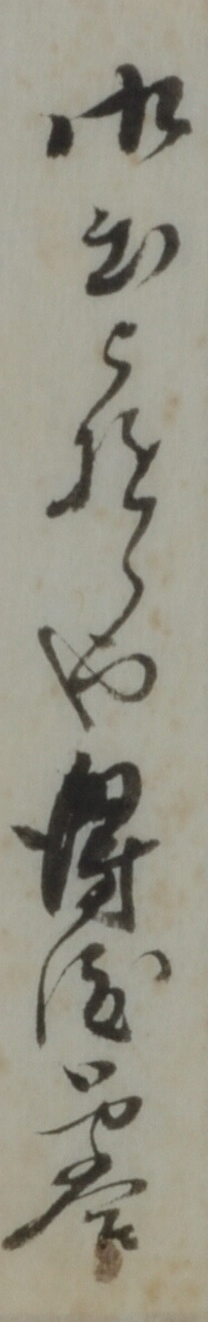御出被遊候也得渡御聞合
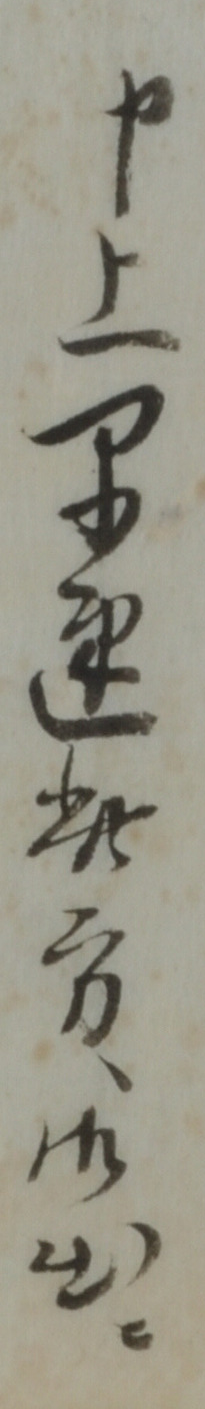申上早速此方へ御出ニ
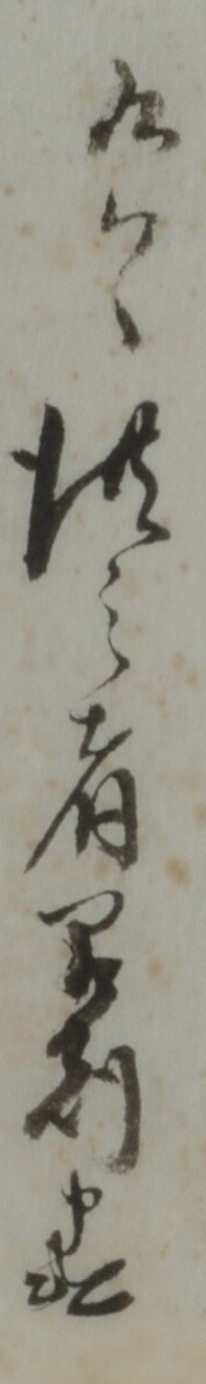候ハヽ供之者即刻申遣
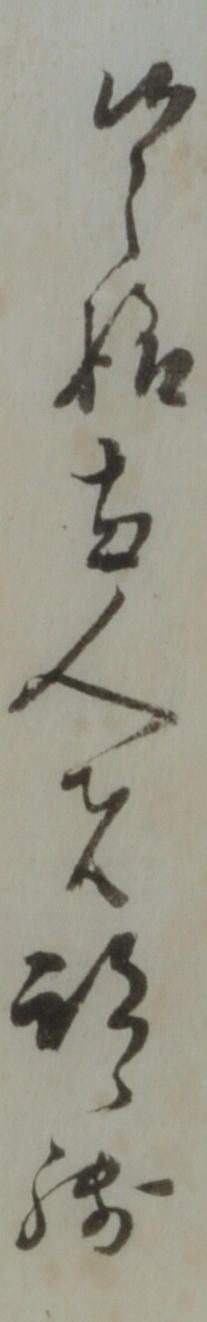候之様両人は跡々残
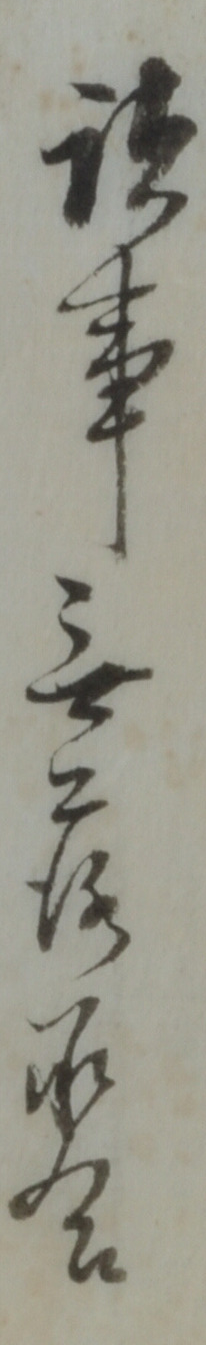諸事無落承合
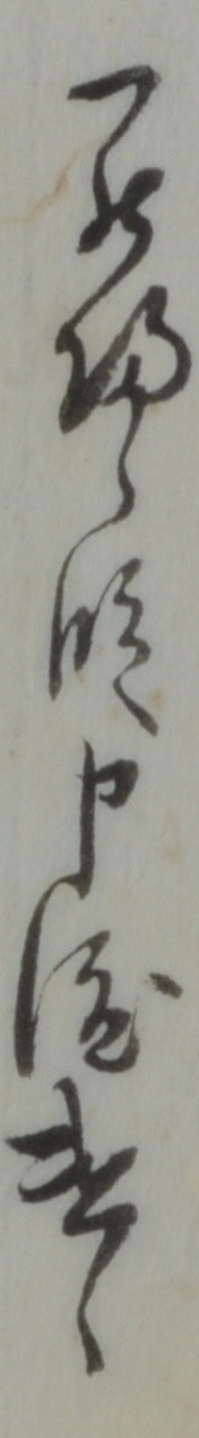罷帰候段申渡遣候

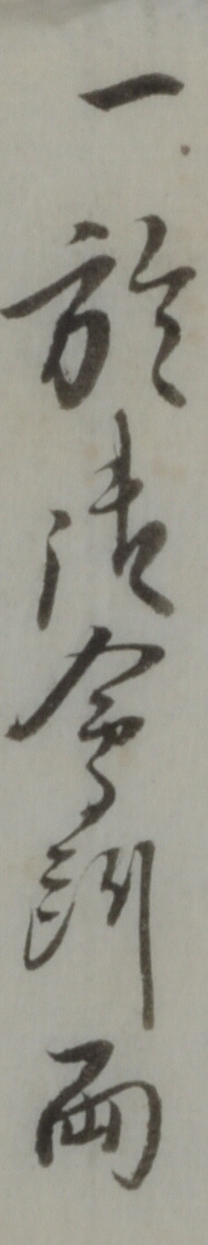一於御会所両
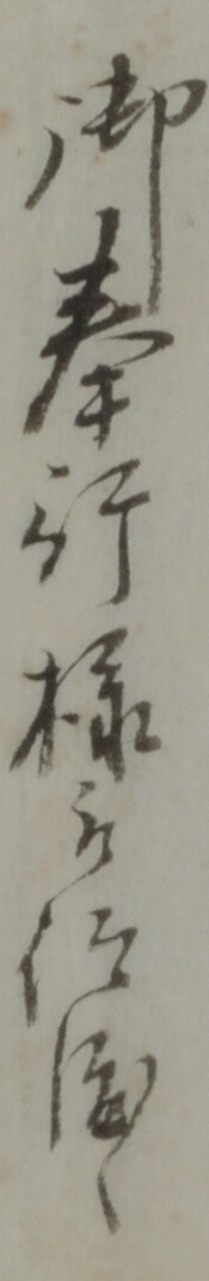御奉行様被仰渡候
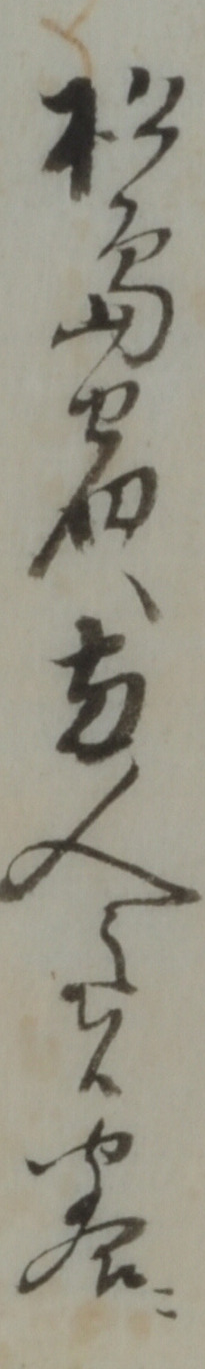松島宿へ両人之者聞合ニ
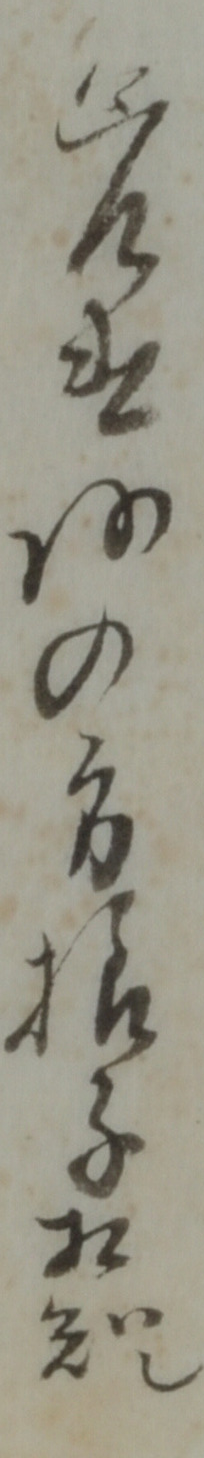差遣何の方様子相知レ
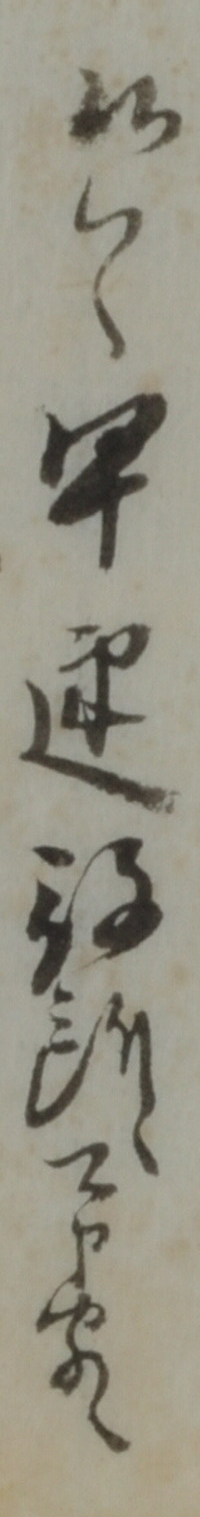候ハヽ早速役所へ可申聞候
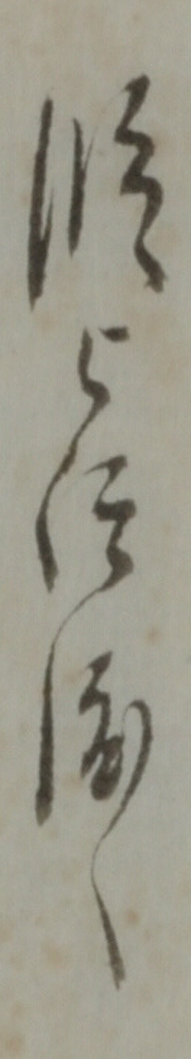段被仰渡候
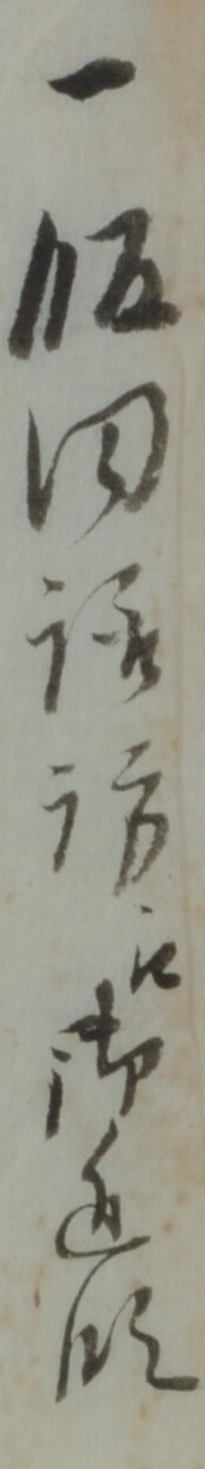一飯田諏訪江御近領
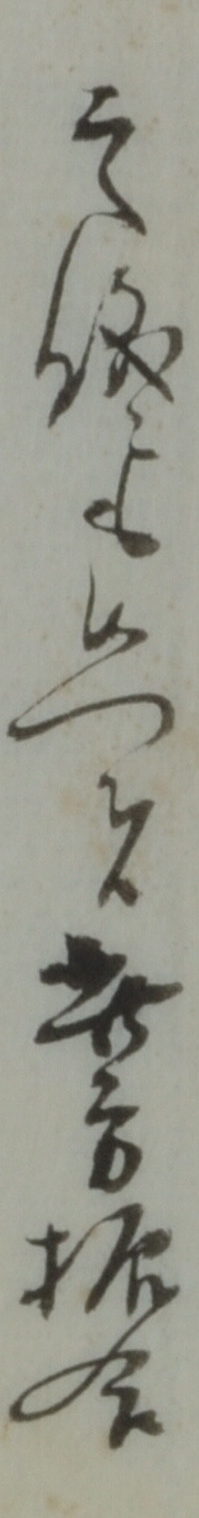之儀ニも候へは此方振合
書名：御勘定御普請役江戸御役人様諸事控
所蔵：伊那市立高遠町図書館・合同会社AMANE
